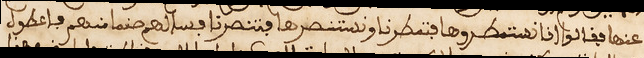عنها فقالوا انا نستمطروها فتمطرنا ونستنصرها فتنصرنا فسالهم صنما منهم فاعطوه
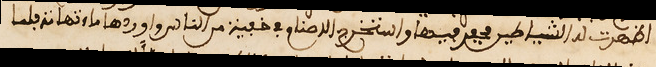اظهرت له الشياطين فحفر فيها واستحرج الاصنام في خفية من الناس واوردها ماء تهامة فلما
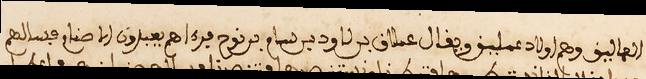الهاليق وهم اولاد عمليق ويقال عملاق بن لاود بن سام بن نوح فرءاهم يعبدون الاصنام فسالهم
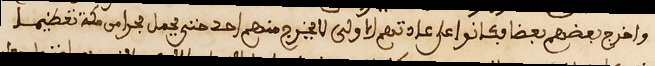واخرج بعضهم بعضا فكانوا على عادتهم الاولى لا يخرج منهم احد حتى يحمل فحرا من مكة تعظيما
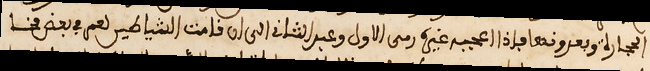الحجارة وبعد ونها فاذا اعجبه غيره رمى الاول وعبد الثانى الى ان قامت الشياطين لعمر في بعض مخا
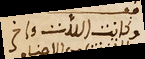وكانت اللدت ءاخر
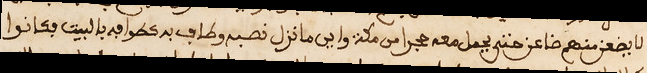لا يضعن منهم ضاعن حتى يحمل معه حجرا من مكة واين ما نزل نصبه وطاف به كطوافه بالبيت فكانوا
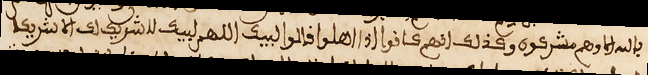بالله الا وهم مشركون وكذلك انهم كانوا اذا اهلوا قالوا لبيك اللهم لبيك لا شريك لك الا شريكا
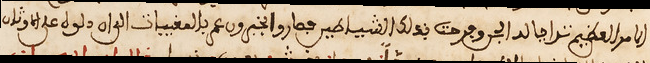الامرالعظيم ترايا له الجن وفرحت بذ لك الشياطين فصاروا بخبرون عمر بالمغيبات الى ان دلوه على الا وثان
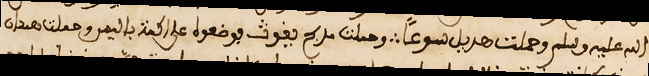الله عليه وسلم وحملت هديل سوعاً وحملت مدحج يغوث فوضعوه على اكمة باليمن وحملت همدان
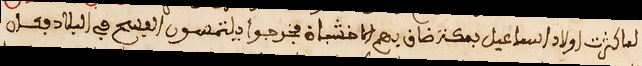لما كثرت اولاد اسماعيل بمكة ضاق بهم الاخشباه فخرجوا يلتمسون الفسح في البلاد فكان
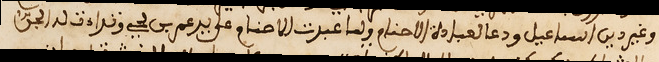وغير دين اسماعيل ودعا العبادة الاصنام ولما عبدت الاصنام على يد عمر بن لحي وتراءت له الجنّ
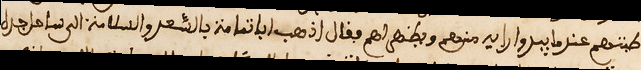طبتهم عند ما يبدوا رايه منهم ويظهراهم فقال اذهب ابا تمامة بالشعر والسلامة الى ساحل جده
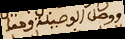ووصل الوصينة وحما
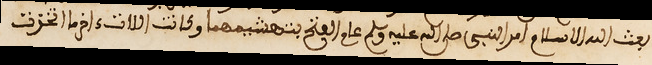بعث الله الاسلام امر النبى صلى الله عليه وسلم عام الفتح بتهشيمهما وكانت اللات ءاخر ما اتخذت
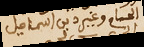الحمام وغيرد بن اسماعيل
